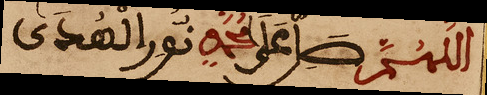اللهم صل على محمد نور الهدى
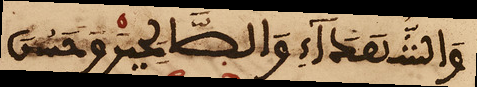والشهدآء والصالحين وحسن
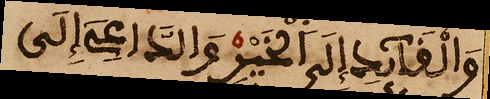والقآئد إلى الخير والداعي إلى
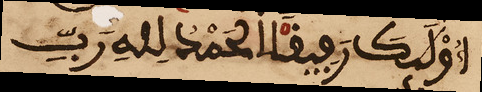أولائك رفيقا الحمد لله رب
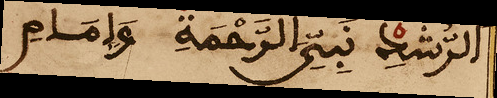الرشد نبي الرحمة وإمام
